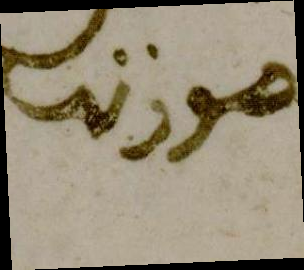صورتها
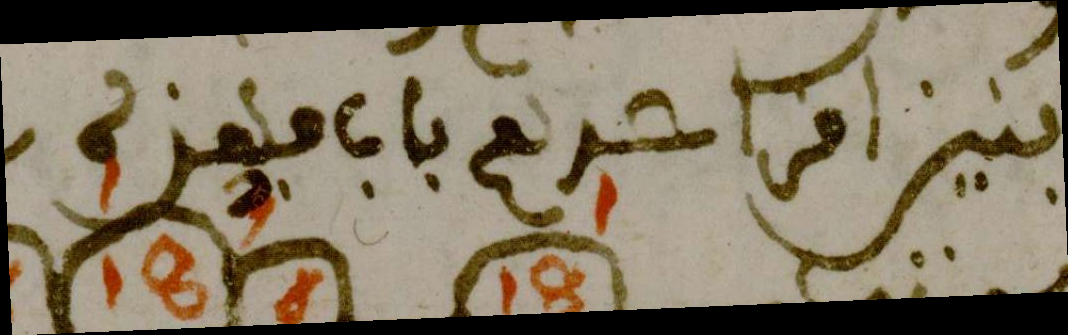بنين اقر احدهم باب فهذه
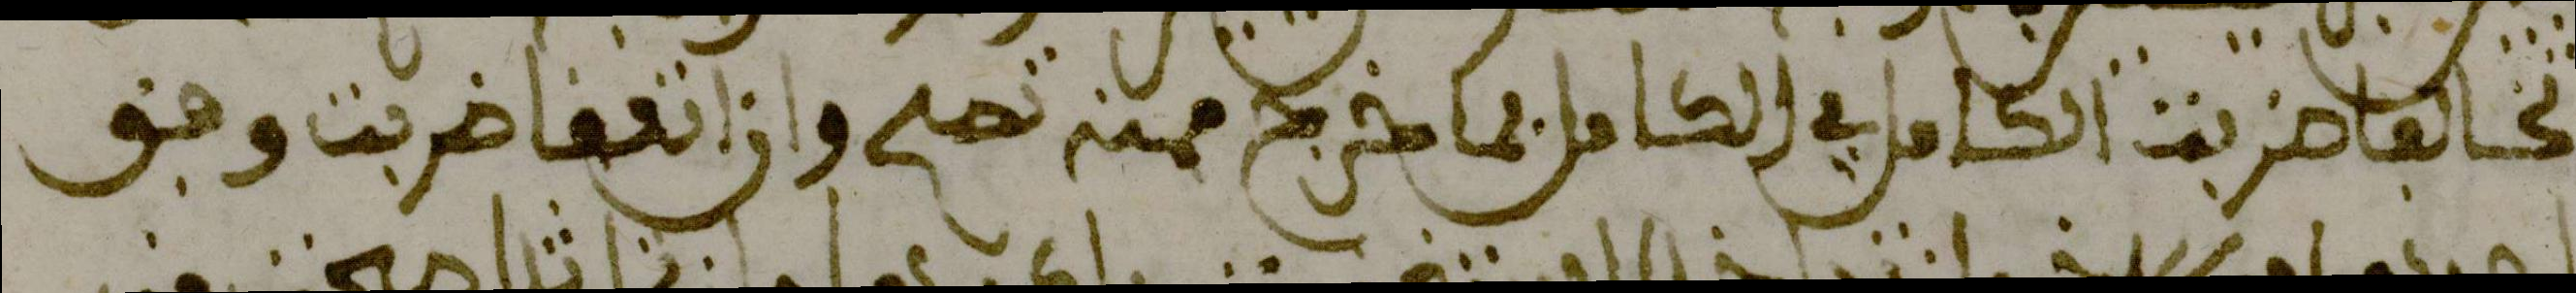تخالفا ضربت الكامل في الكامل فما خرة فمنه تصح وان اتفقا ضربت وفق
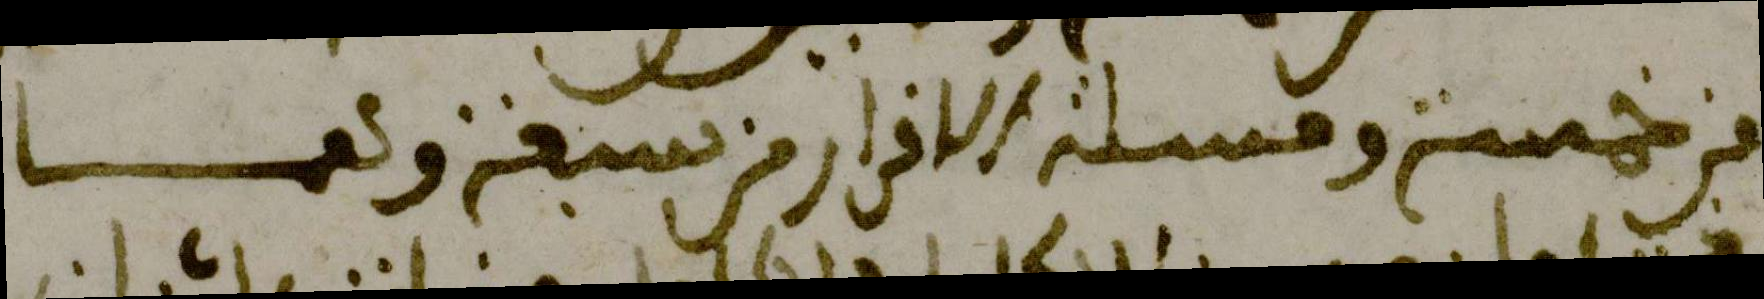من خمسة ومسلة الاقرار من سبعة وهما
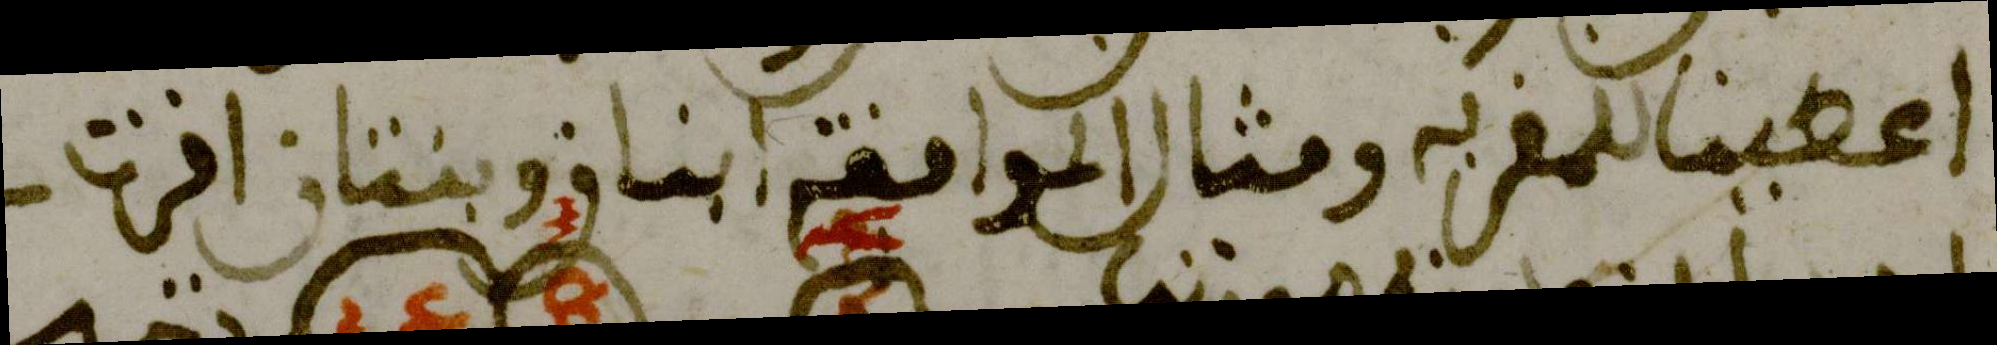اعطينا للقمر به ومثال الموافقة ابنان وبنتان اقرت
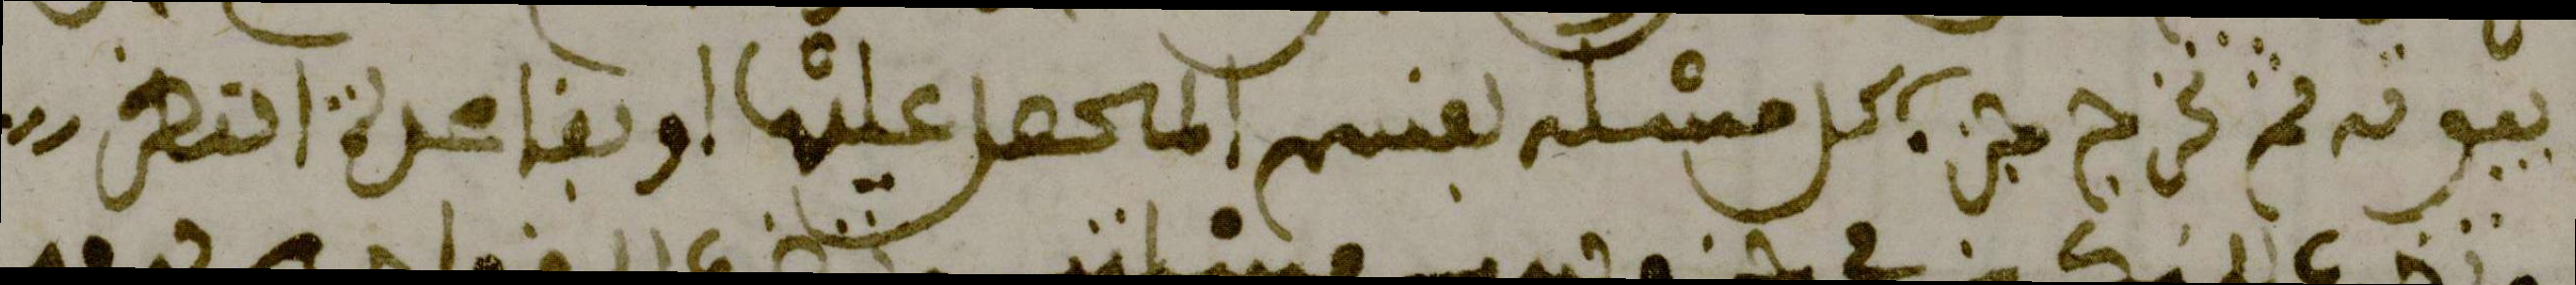بيوته ثم نخرج جزء كل مسْله بقسم المحصل عليْها او بقاعدة النظر
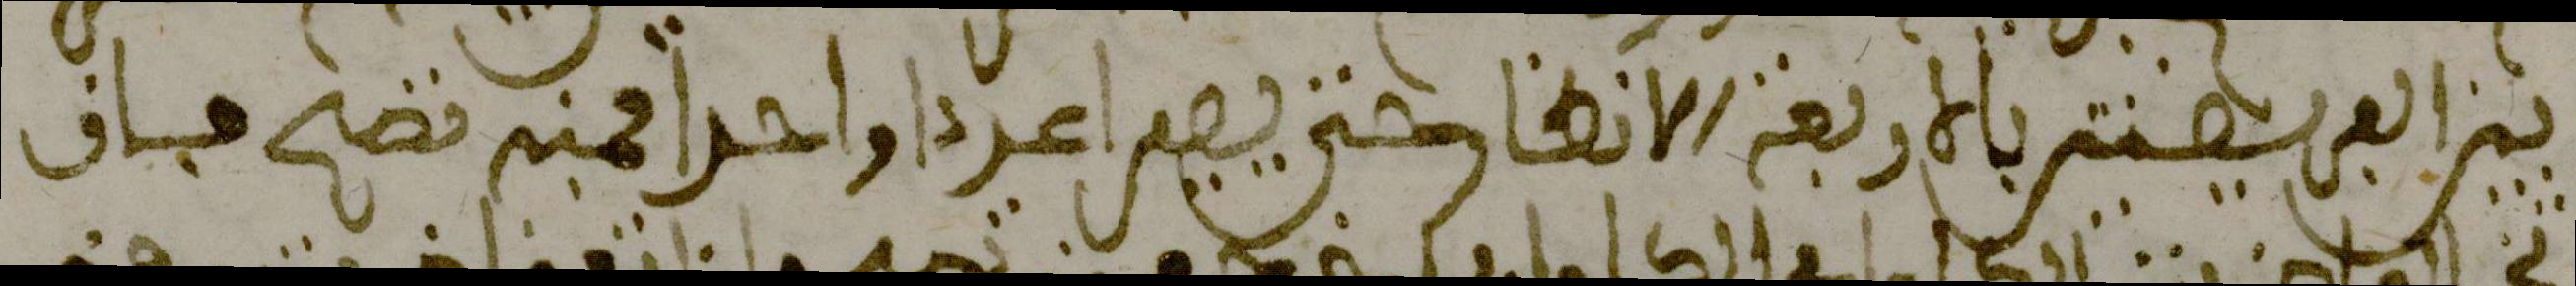بين الفريضتين بالاربعة الانظار حتى يصيرا عددا واحدا فمنه تصح فان
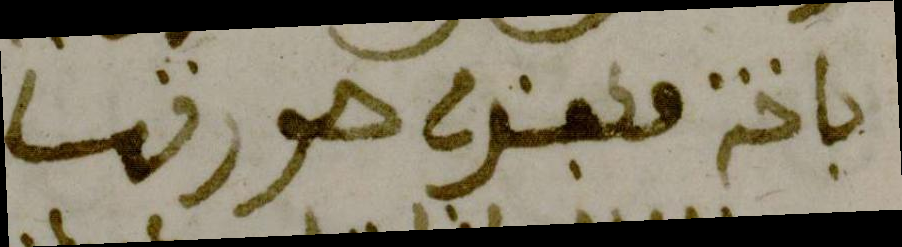باخة فهذه صورتها
